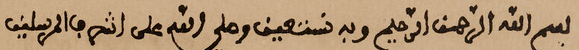بسم الله الرحمن الرحيم وبه نستعين وصلى الله على اشرف المرسلين
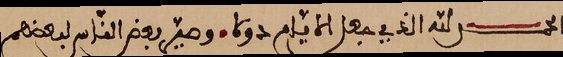الحمد لله الذي جعل الايام دولا وصير بعض الناس لبعضهم
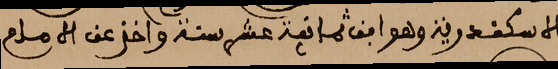الإسكندرية وهو ابن ثمانية عشر سنة واخد عن الامام
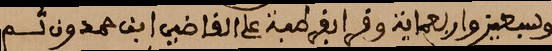وسبعين واربعماية وقرا بقرطبة على القاضي ابن حمدون ثم
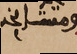ومشايخه
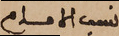نسب الامام
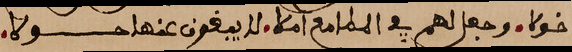خولا وجعل لهم في المطامع املا لا يبغون عنها حولا
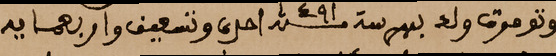وتومرت ولد بمهرسة سنه احدى وتسعين واربعمايه
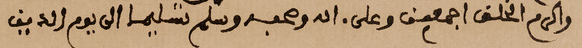واكرم الخلق اجمعين وعلى اله وصحبه وسلم تسليما الى يوم الدين
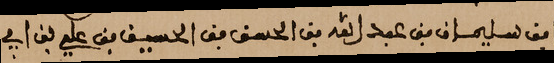ابن سليمان بن عبد الله بن الحسن بن الحسين بن علي بن ابي
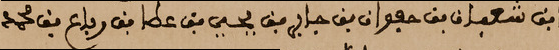ابن شعبان صفوان بن جابر بن يحيى بن عطا بن رباع بن محمد
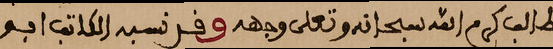طالب كرم الله سبحانه وتعلى وجهه وقر نسبه الكاتب ابو
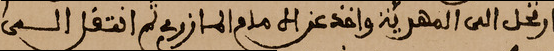ارتحل الى المهدية واخد عن الامام المازري ثم انتقل الى
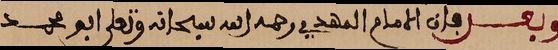وبعد فان الامام المهدي رحمه الله سبحانه وتعلى ابومحمد
